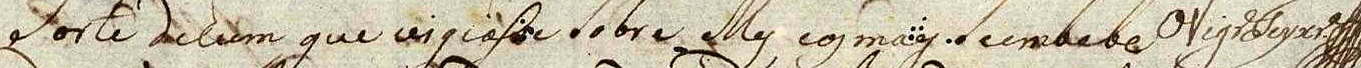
Sorte de hum que vigiasse sobre elles, e os maes se embebe O Vigr.o Teyxr.a
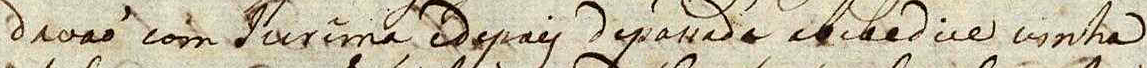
davão com Iurêma, e depois de passada a bebedice vinha
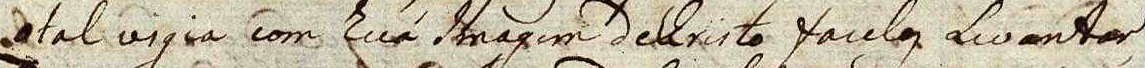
o tal vigia com huā Imagem de Christo fazelos Levantar
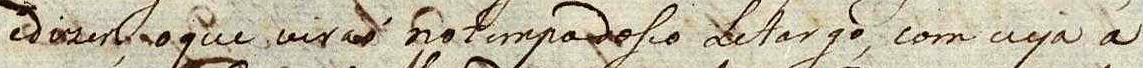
e dizer o que viraõ no tempo do seo Letargo, com cuja a
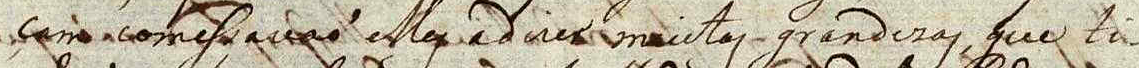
çam comessavaõ elles a dizer muitas grandezas, que ti
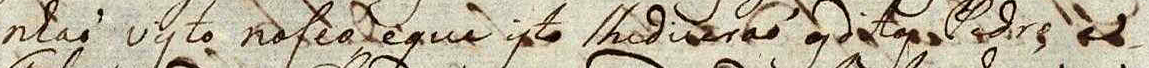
nhaõ visto no Ceo, e que isto lhe diseraõ os ditos Pedro e
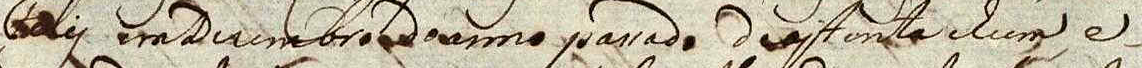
Felis em Dezembro do anno passado de oitenta e hum, e
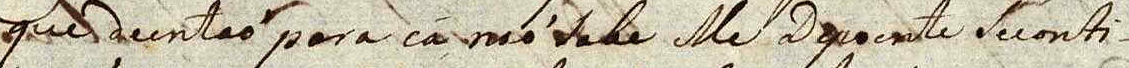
que de entaõ para cá naō sabe elle Depoente se conti
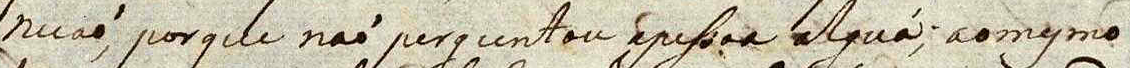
nuaõ, porque naō perguntou a pessoa alguā; ao mesmo
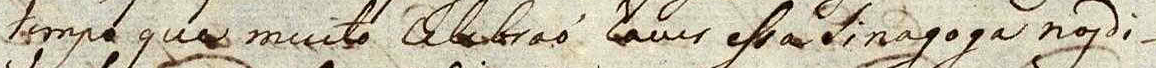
tempo que muito celebraõ haver essa Sinagoga nos di
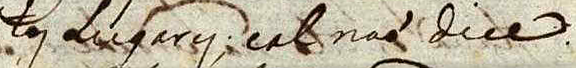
tos Lugares; e al naō dice
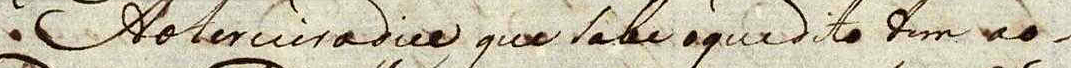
Ao terceiro dice que sabe o que dito tem ao
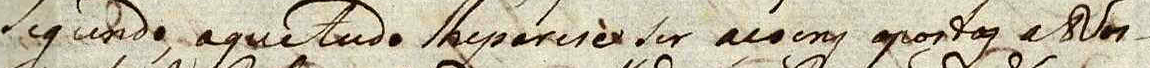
segundo, a que tudo lhe parese ser açoens opostas a Nos
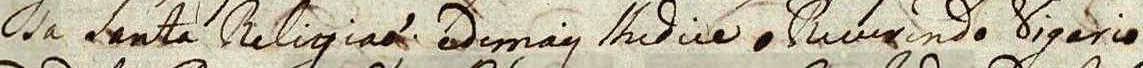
sa Santa Religiaō; e demais lhe dice o Reverendo Vigario
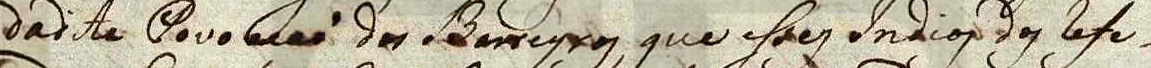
da dita Povoaçaō dos Barreyros, que esses Indios dos Refe
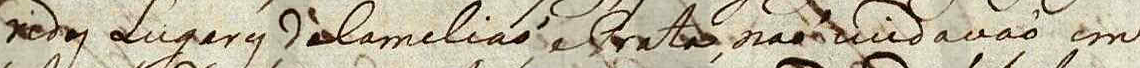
ridos Lugares do Cameliaō e Prata, naõ cuidavaõ em
